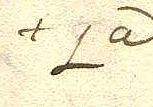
+ 1a
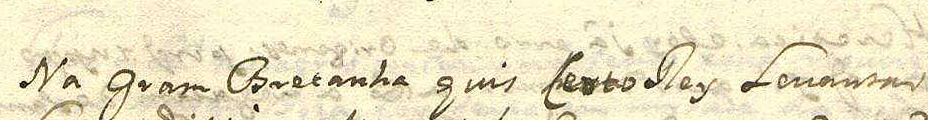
Na Gram Bretanha quis Certo Rey Leuantar
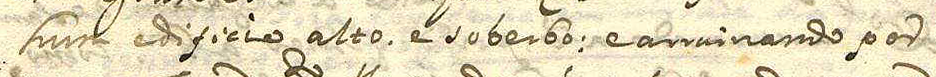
hum edificio alto. e soberbo: e arruinando por
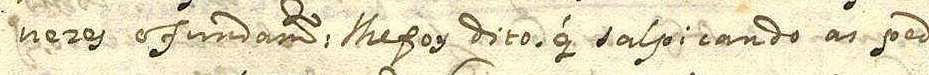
uezes o fundamto; lhe foy dito q̄ salpicando as ped
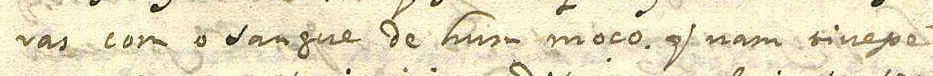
ras com o sangue de hum moço. q̄ nam tiuesse
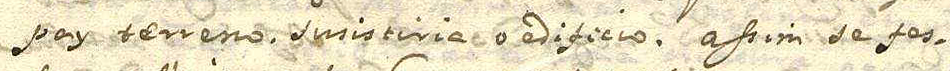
pay terreno. susistiria o edificio. assim se fes
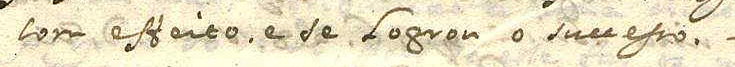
com effeito, e se Logrou o successo.
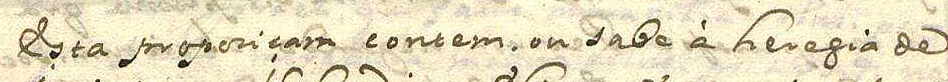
Esta propoziçam contem. ou sabe à heregia de
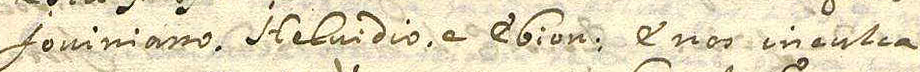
Jouiniano. Heluidio, e Ebion; e nos inculca
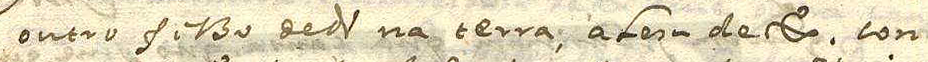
outro filho de ds na terra, alem de Xo. con
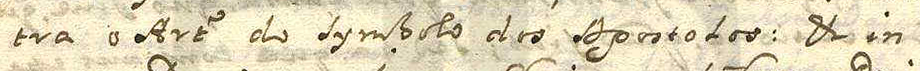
tra o Arto do symbolo dos Apostolos: & in
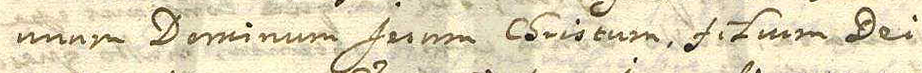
imum Dominum Jesum Christum, fiLium Dei
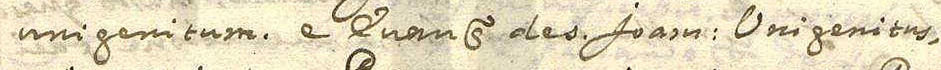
unigenitum. e Euango de s. Joam: Vnigenitus,
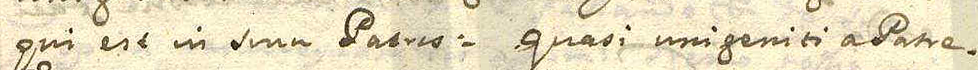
qui este sina Patris = Quasi unigeniti a Patre
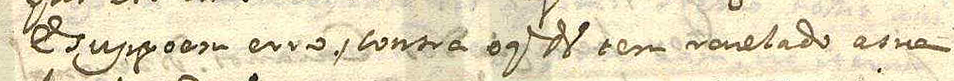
E suppoem erro, contra o q̄ Ds̄ tem reuelado a sua
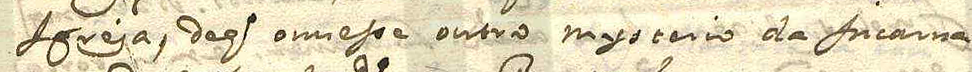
Igreja, de q̄ ouuesse outro mysterio da Jncarna
